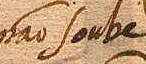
não Soube
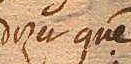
dizer quē
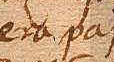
era paj
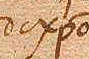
de xp̄o
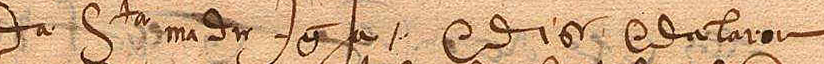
da Sta madre JḡJa /. e dise e declarou
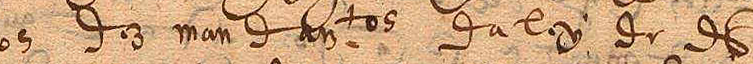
os dez mandamtos da ley de ds̄
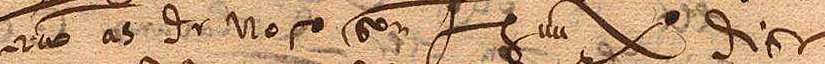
erão as de noso s̄or Jhūu Xo dise
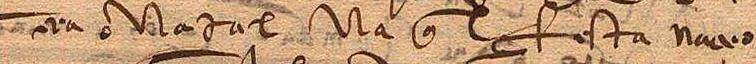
q̄ era o Natal Na q̄l festa naceo
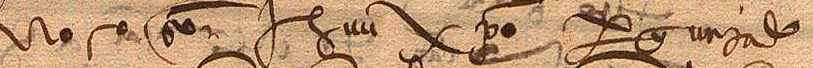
Noso s̄or Jhūu Xp̄o ꝑguntado
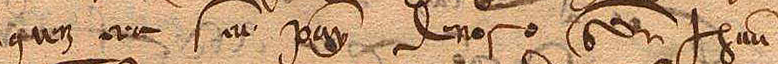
quem era seu pāy de noso s̄or Jhūu
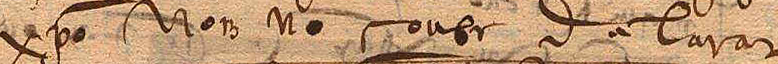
Xp̄o Nom no soube declarar
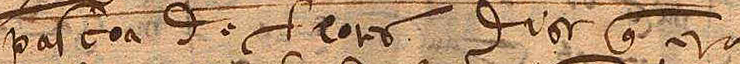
pascoa de flores dise q̄ era
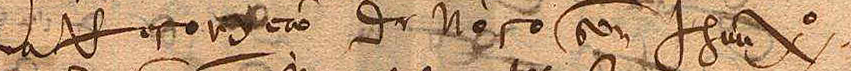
a Resoreyçaõ de noso s̄or Jhūu Xo /.
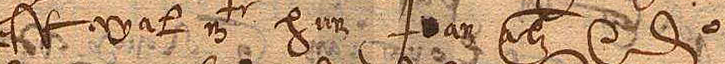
especiaLmte hum Joam ālz e djo
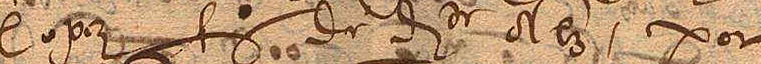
lopez fos de drte Al̄z / por
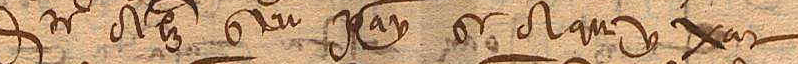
drte Al̄z seu pāy se Aqueyxar
